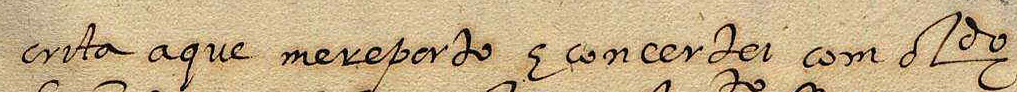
crita a que me reporto E concertei com o Ldo
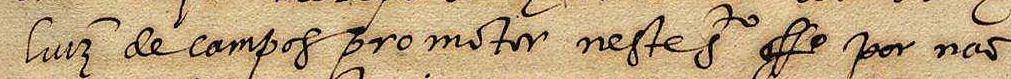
luiz̄ de campos promotor neste sto offo por naõ
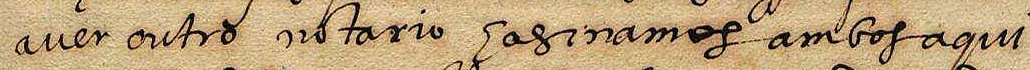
auer outro notario E asinamos ambos aqui
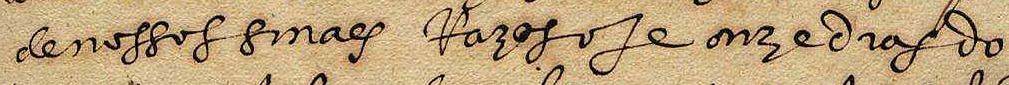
de nossos sinaes Razos oJe onze dias do
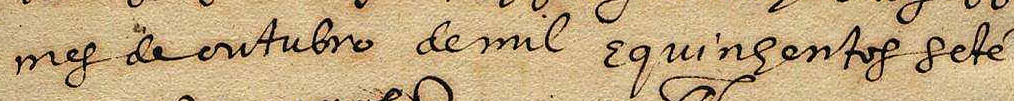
mes de outubro de mil E quinhentos setē
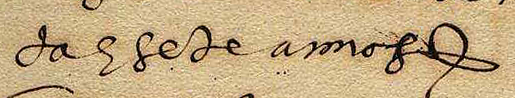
ta E sete annos
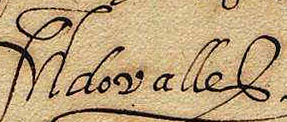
M do valle
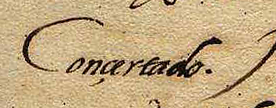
Concertado.
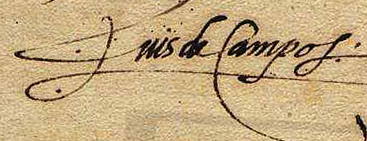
Luis de Campos.
